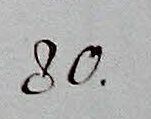80.
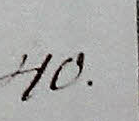40.
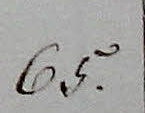65.
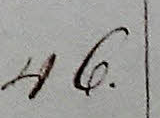46.
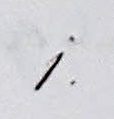1.
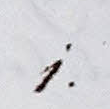1.
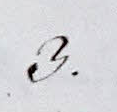3.
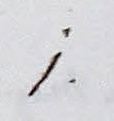1.
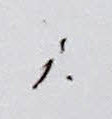1.
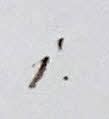1.
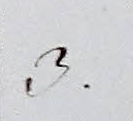3.
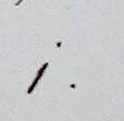1.
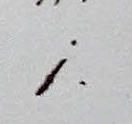1.
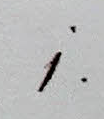1
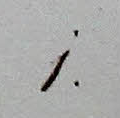1.
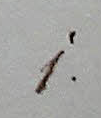1
